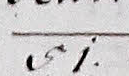51.
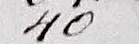40
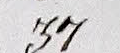37
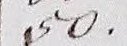50
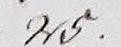25
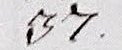37
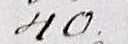40.
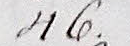46.
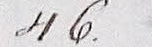46.
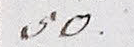50.
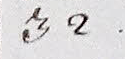32
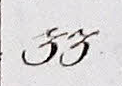33
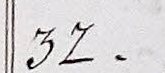32.
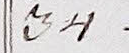34
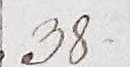38
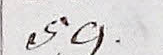59.
